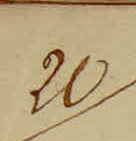20
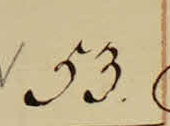53.
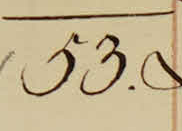53.
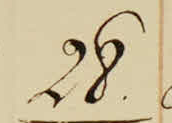28.
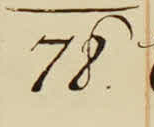78.
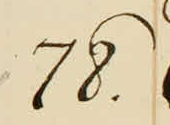78.
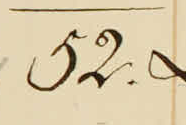52.
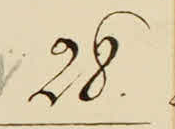28.
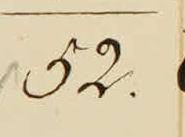52.
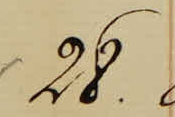28.
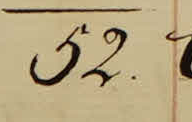52.
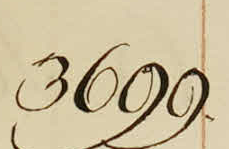3699
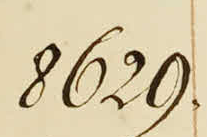8629
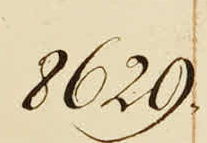8629
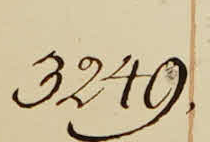3249
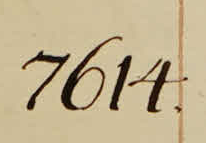7614
